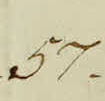57
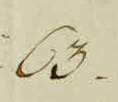63
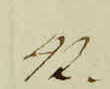42
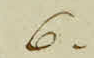6
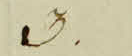3.
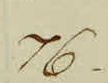76
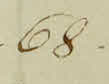68
